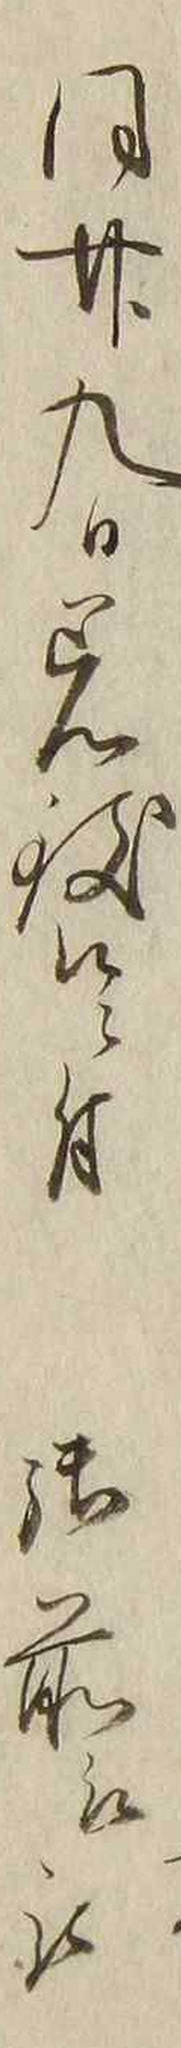同廿九日着致候に付御前江被
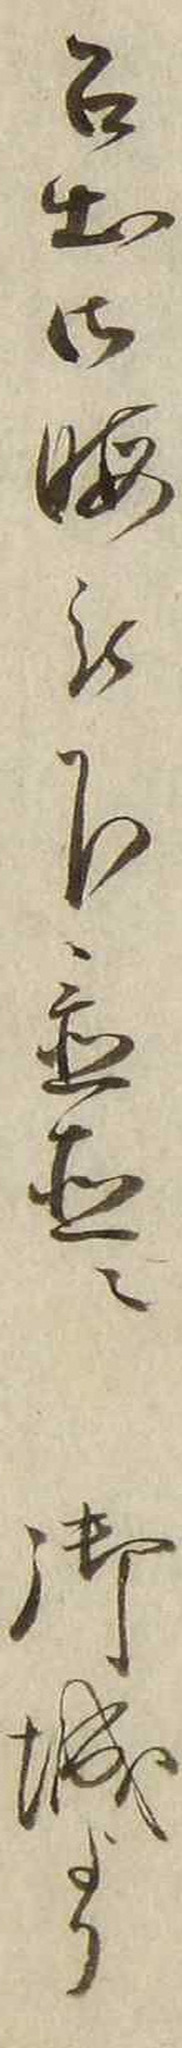召出御暇被下置直に御城より

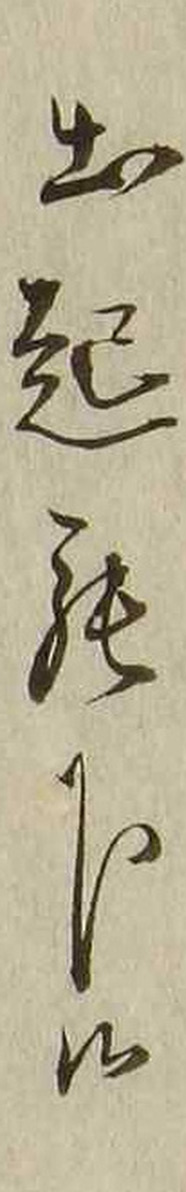出起罷下候
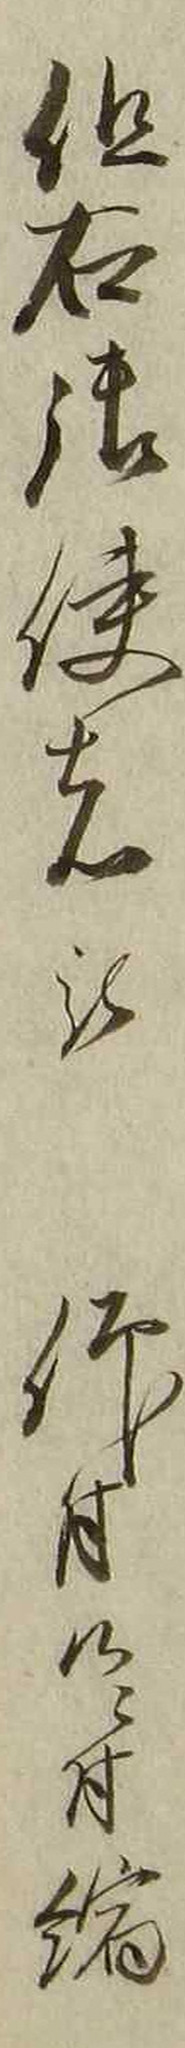但右御使者被仰付候に付縮
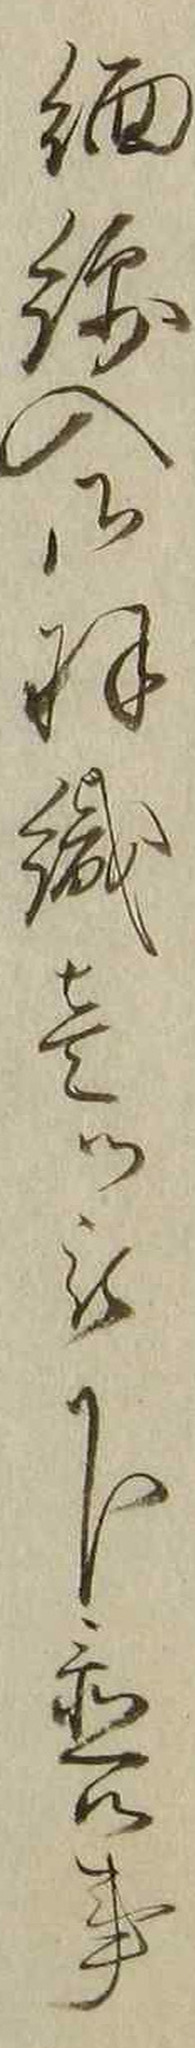緬綿入御羽織壱つ被下置候事
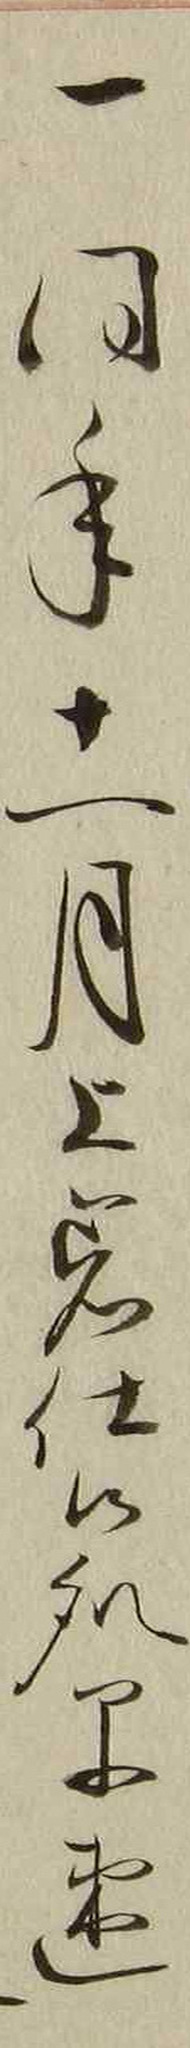一同年十一月上着仕候処早速
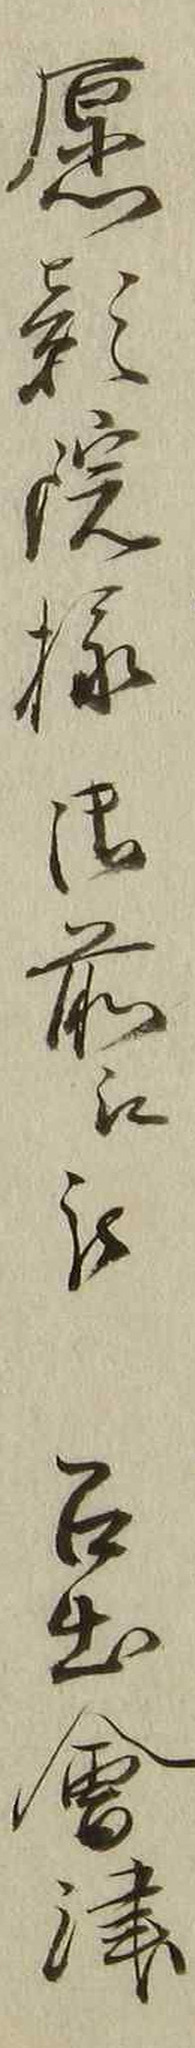愿彰院様御前江被召出会津
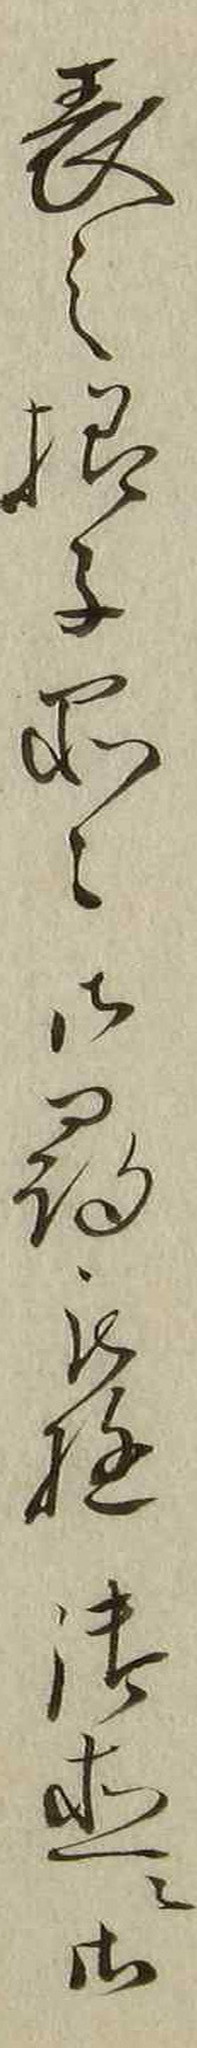表之様子品々御尋被遊御直に御
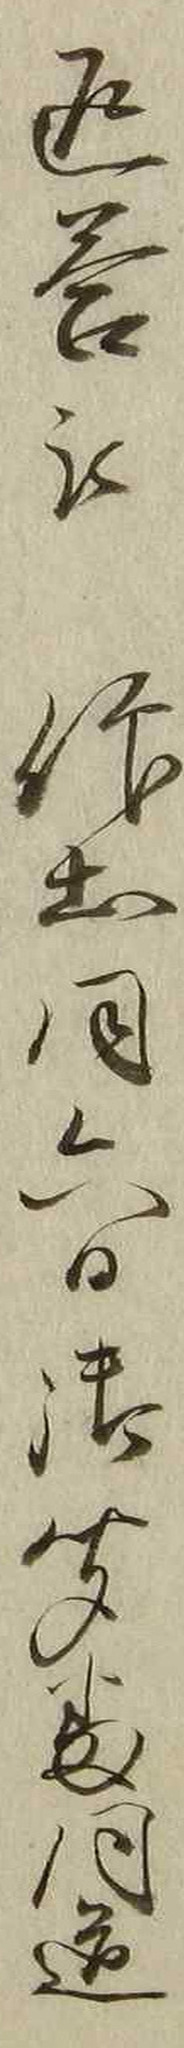返答被仰出同六日御聞番同道
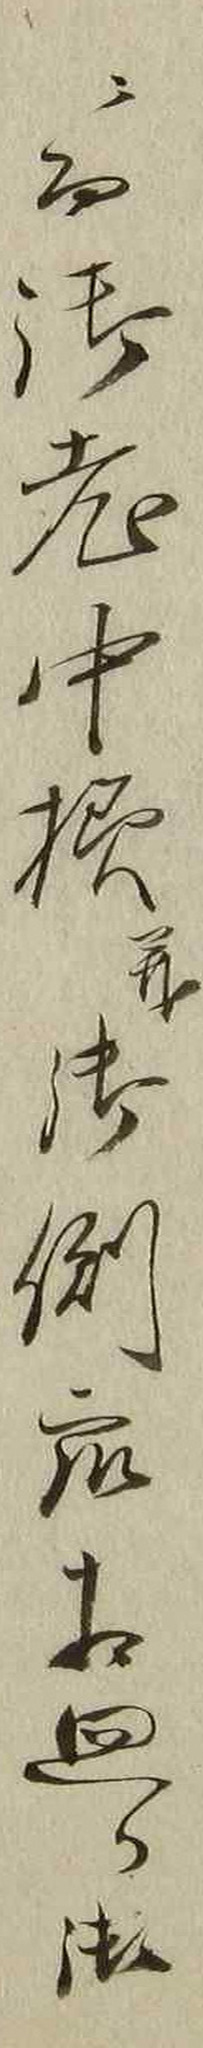に而御老中様并御側衆相廻御
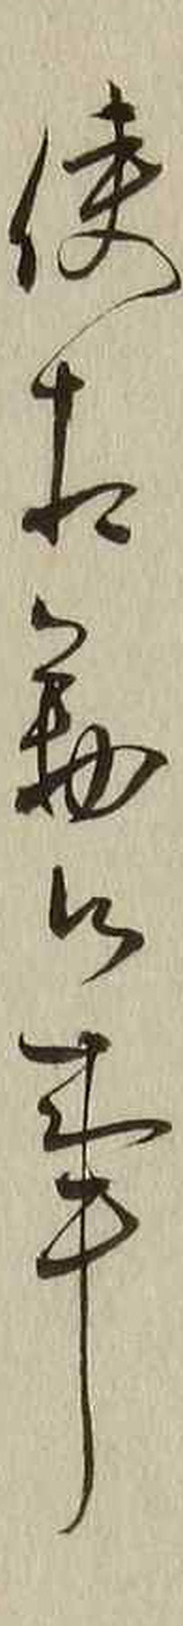使相勤候事
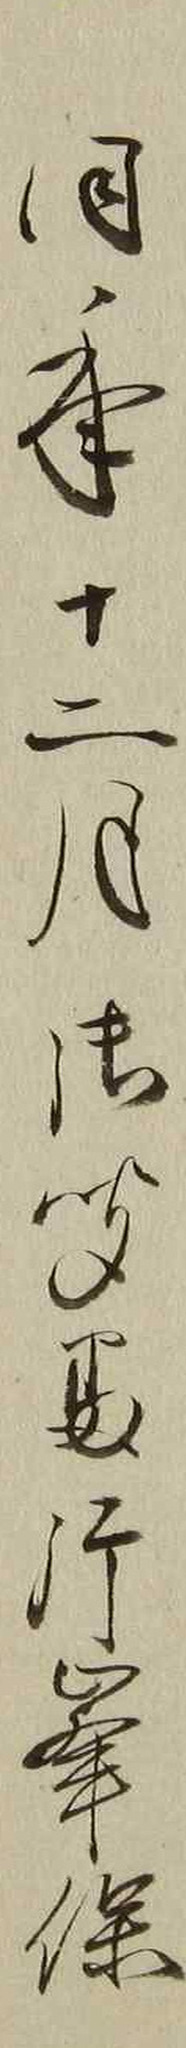一同年十二月御聞番片峯保
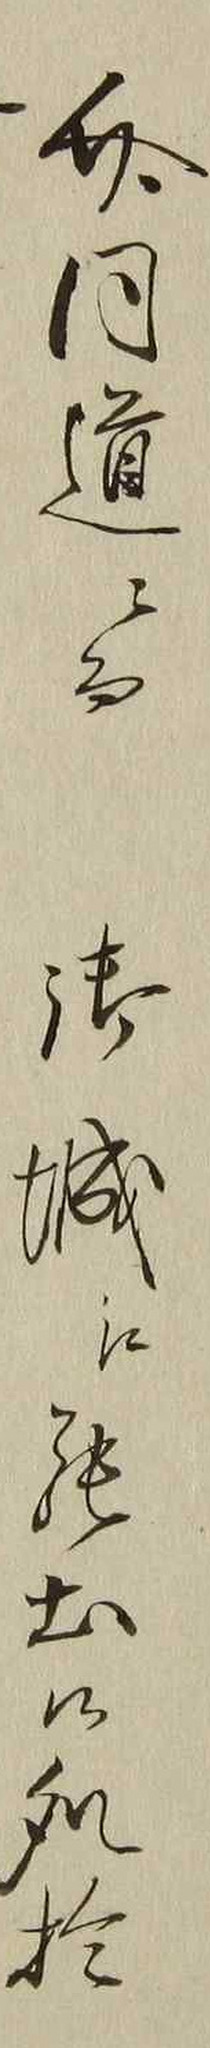介同道に而御城江罷登候処於
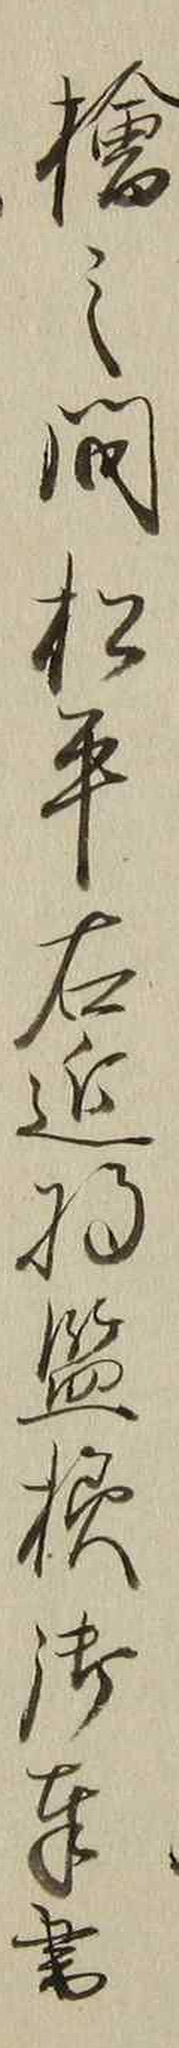桧之問松平右近将監様御奉書
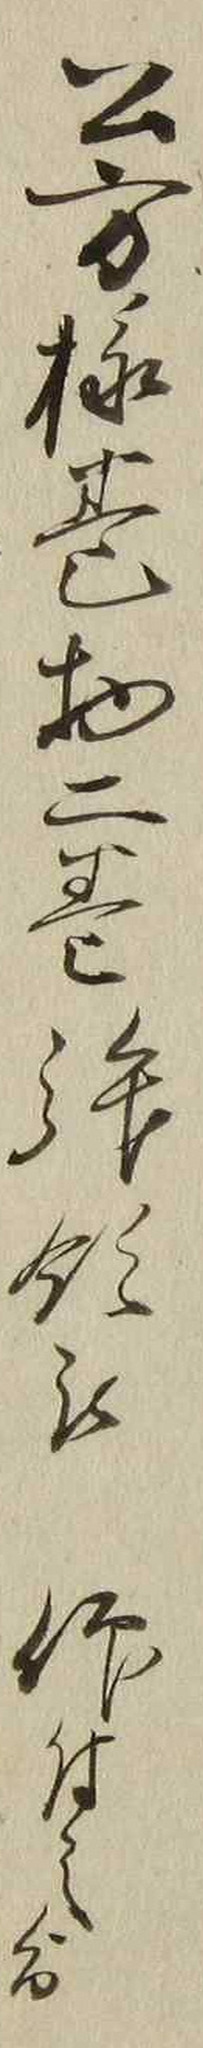公方様巻物二巻拝領被仰付之旨
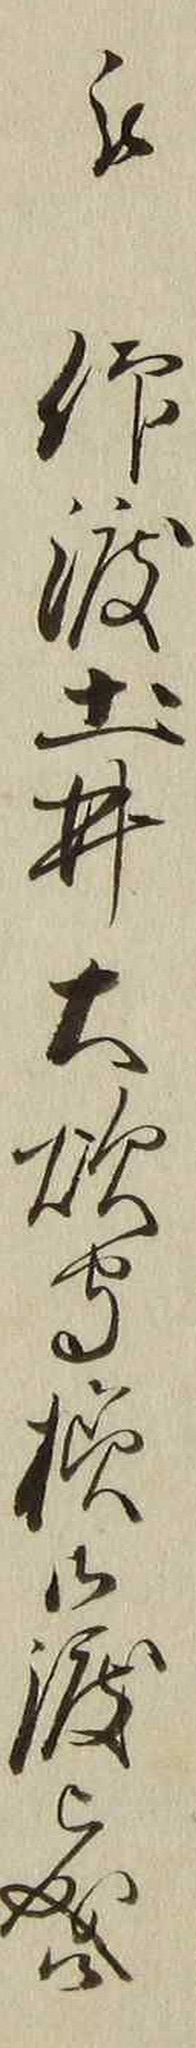被仰渡土井大炊守様御渡被成儀候
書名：諸士系譜　巻之103　か之部11
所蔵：会津若松市立会津図書館
